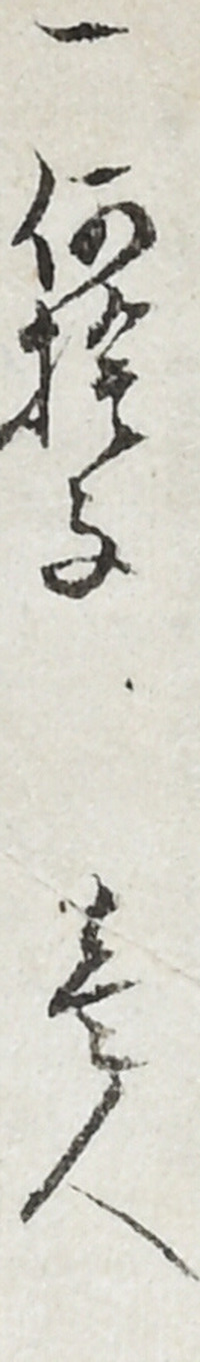一何捨子壱人
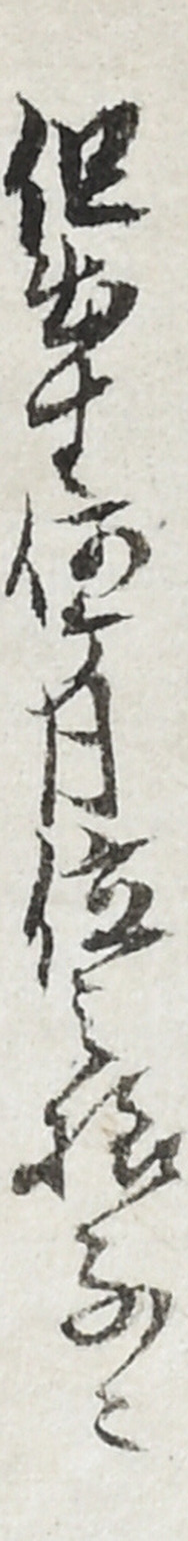但出生何ケ月位之様子ニ
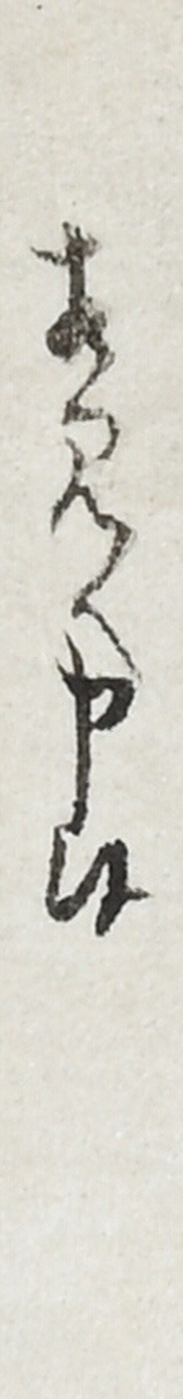相見へ申候
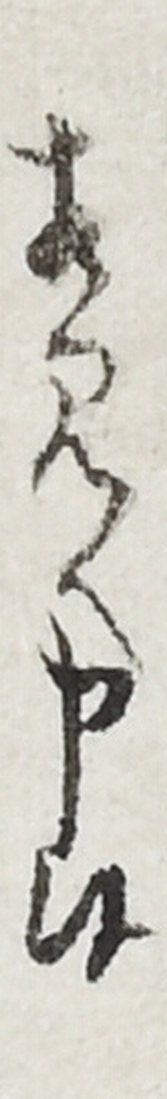相見へ申候
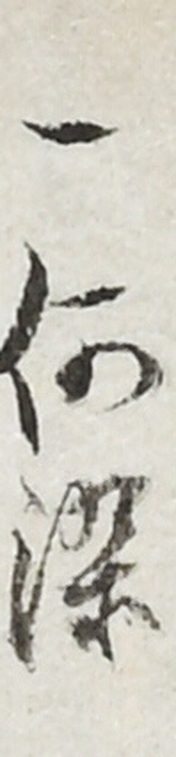一何染
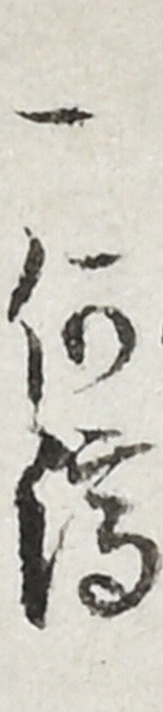一何染
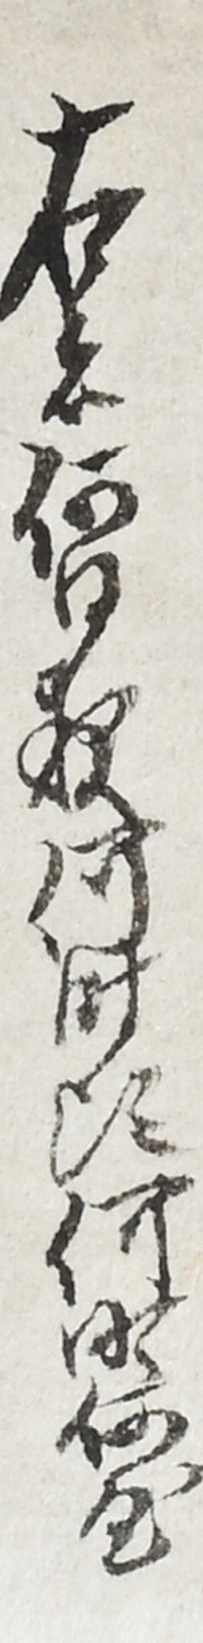右は何日夜何時頃何町何屋
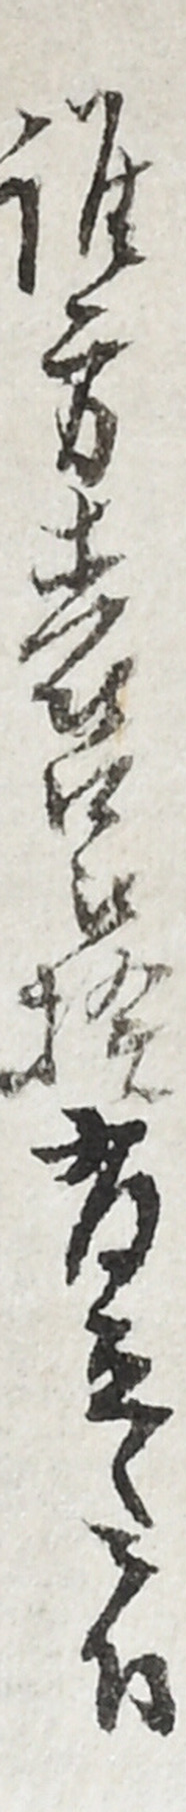誰方表江被捨有之候ニ付
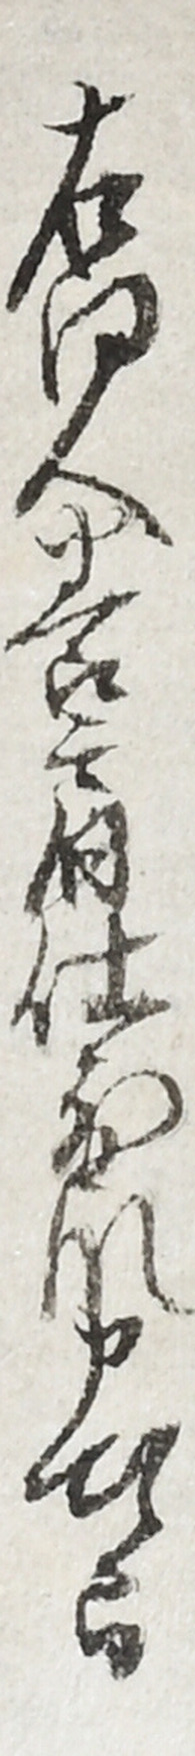右同人養肩仕度所申出候ニ而
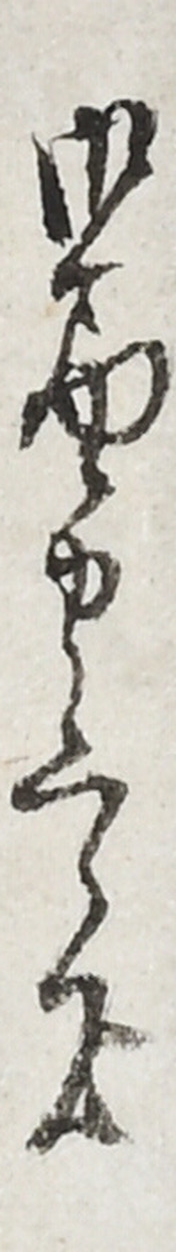御届申上候以上
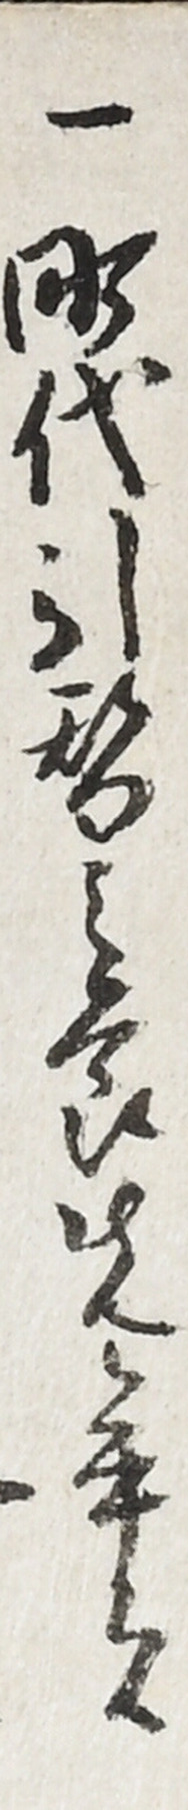一町代引替之節先年者
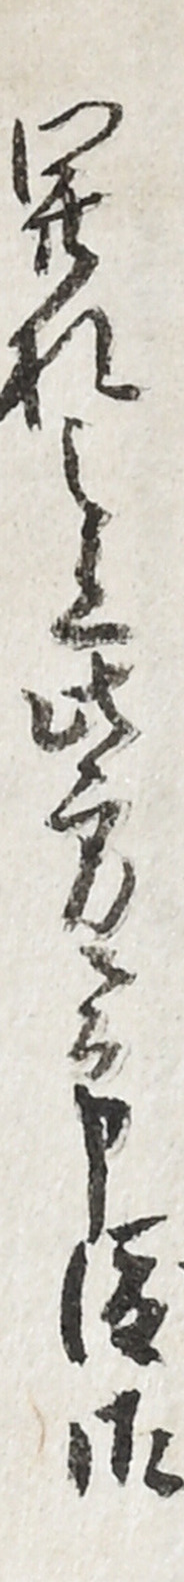開札之上此方二而申渡御
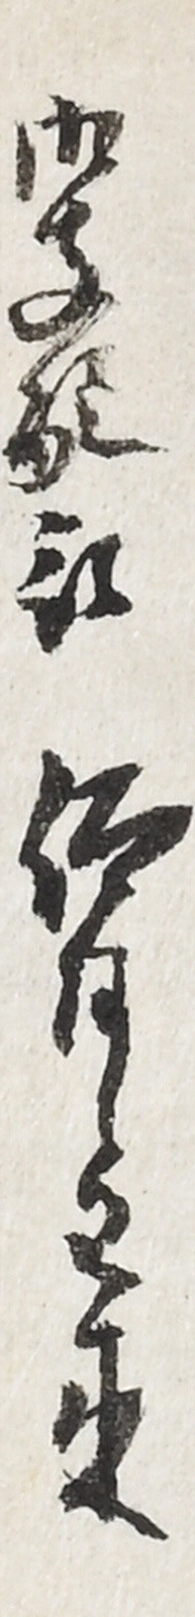御支配被仰付候已来
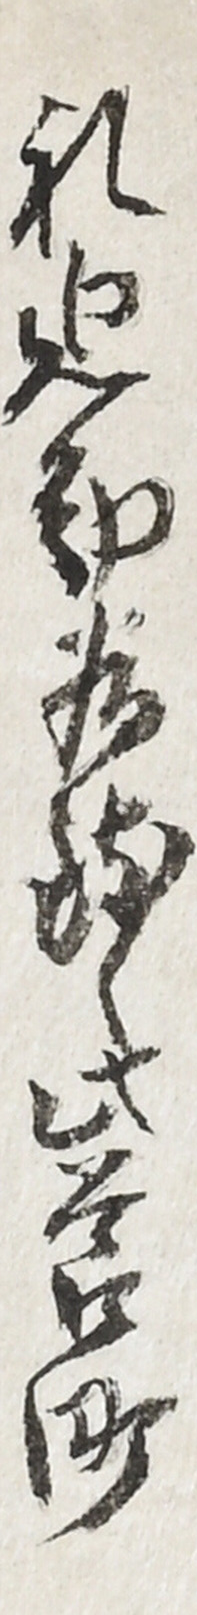礼廻勤為致候此節町
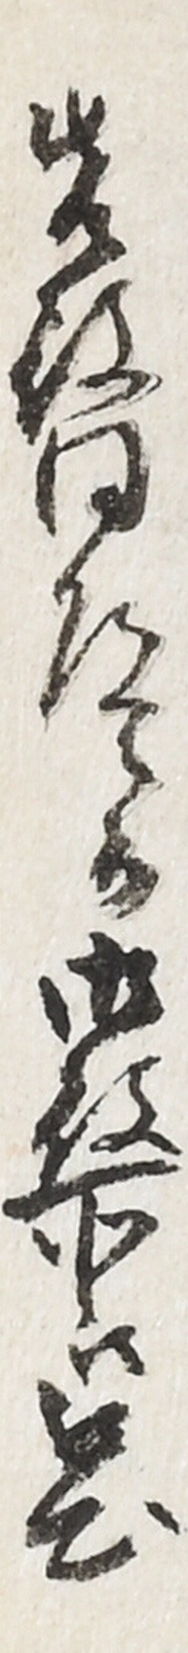先役同道ニ而御役所江口出
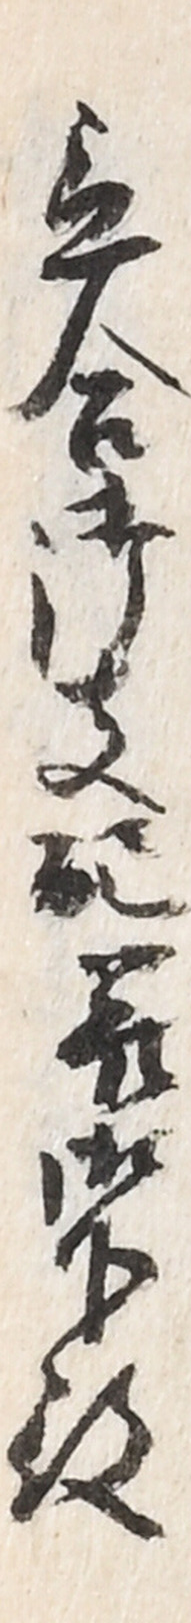立合御支配幷御下役
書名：年内行事懐中録
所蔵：伊那市立高遠町図書館・合同会社AMANE
